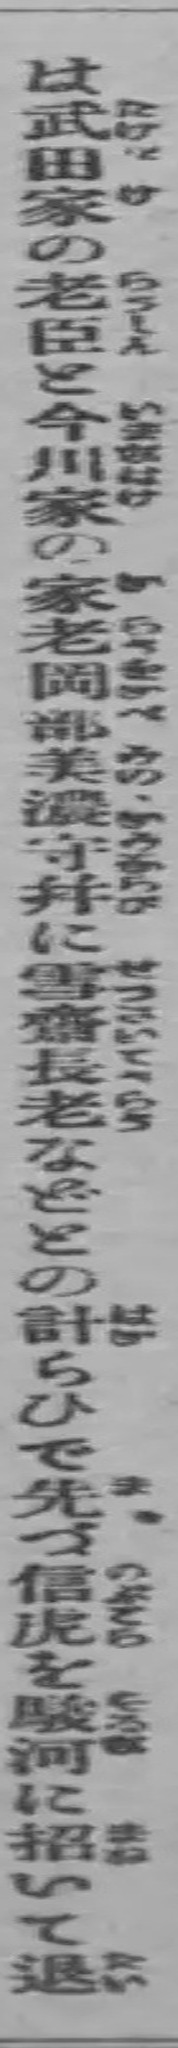は武田家の老臣と今川家の家老岡部美濃守幷に雪斎長老などとの計らひで先づ信虎を駿河に招いて退
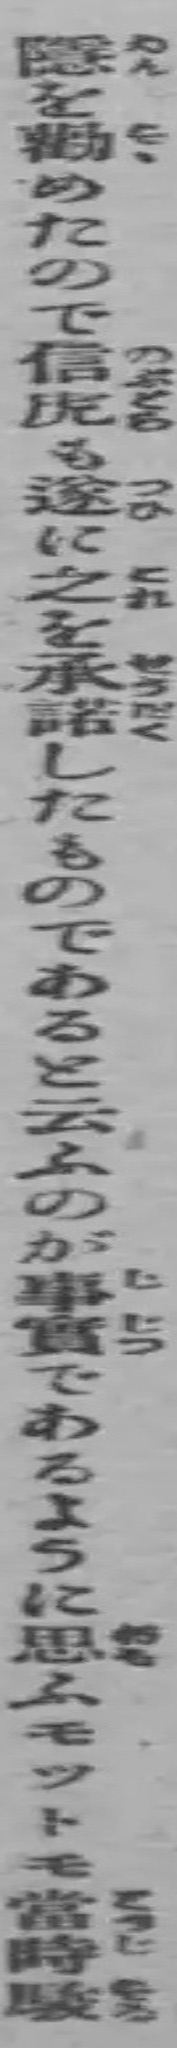隠を勧めたので信虎も遂に之を承諾したものであると云うのが事実であるように思ふモツトモ当時駿
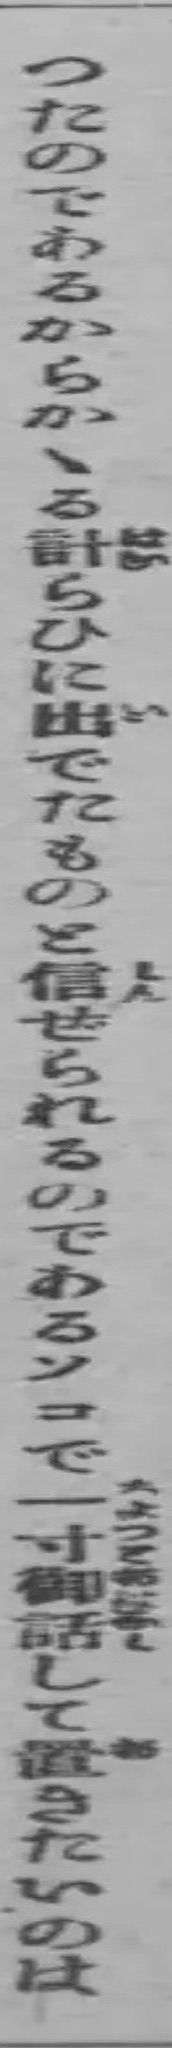山本勘介つたのであるからかゝる計らひに出でたものと信ぜられるのであるソコで一寸御話して置きたいのは
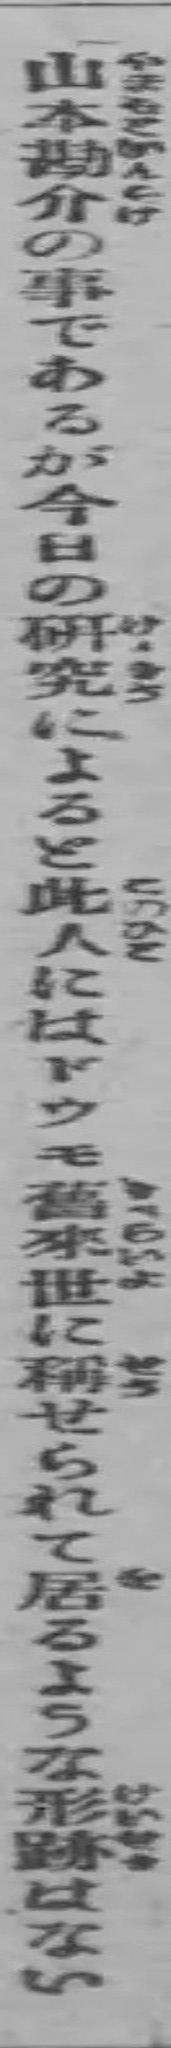山本勘介の事であるが今日の研究によると此人にはドウモ旧来世に称せられて居るような形跡はない
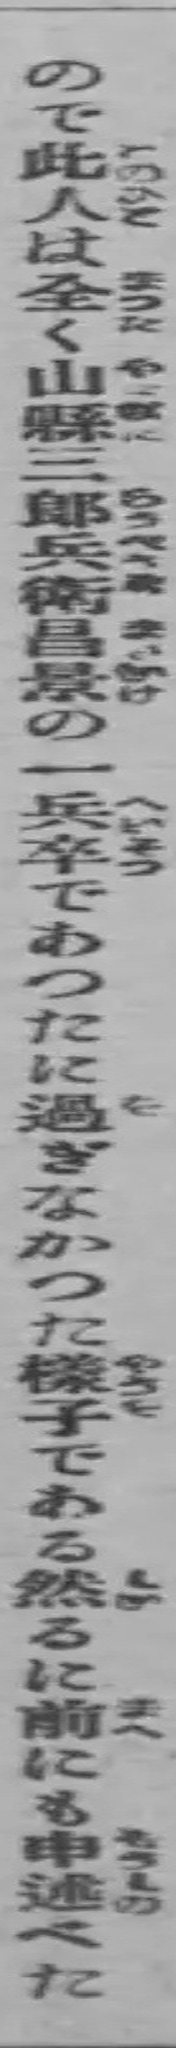ので此人は全く山縣三郎兵衛昌景の一兵卒であつたに過ぎなかつた様子である然るに前に申述べた
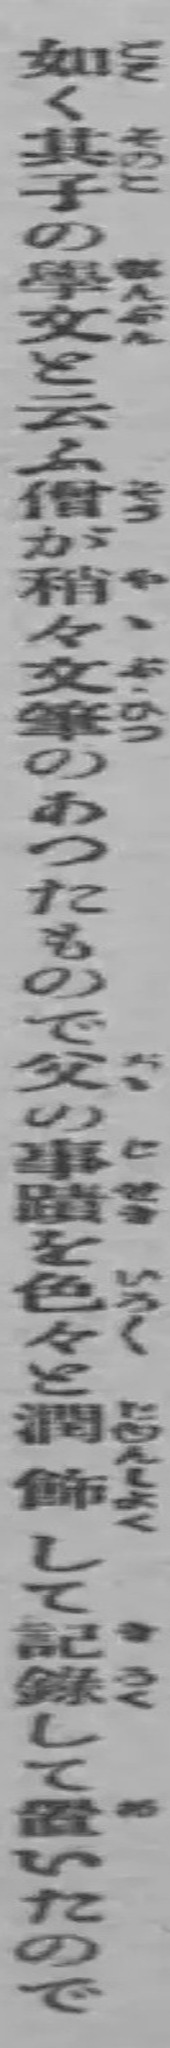如く其子の学文と云ふ僧が稍々文筆のあつたもので父の事蹟を色々と潤飾して記録して置いたので
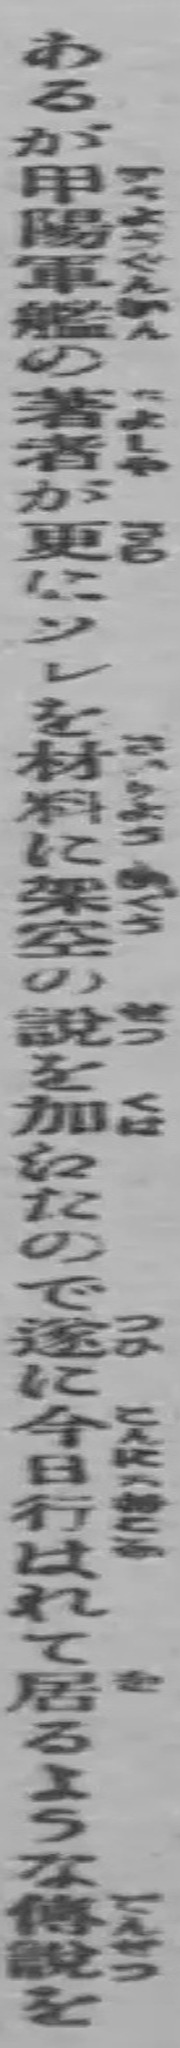あるが甲陽軍鑑の著者が更にソレを材料に架空の説を加えたので遂に今日行はれて居るような伝説を
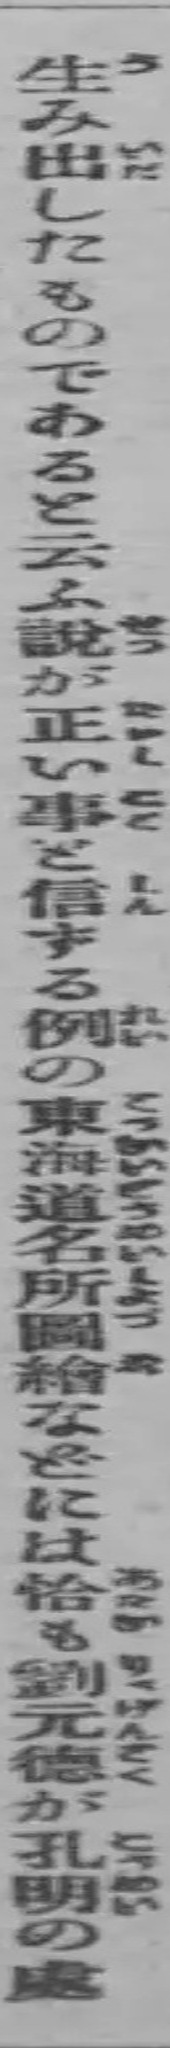生み出したものであると云ふ説が正い事と信ずる例の東海道名所図絵などには恰も劉元徳が孔明の処
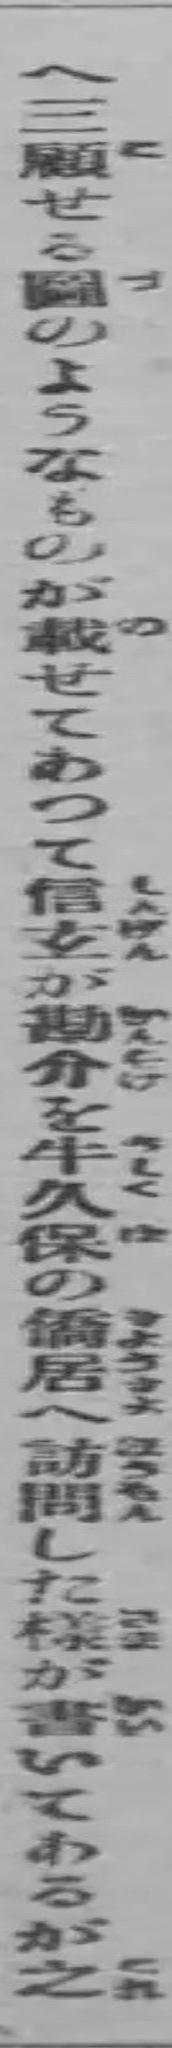へ三顧せる図のようなものが載せてあつて信玄が勘介を牛久保の僑居へ訪問した様が書いてあるが之
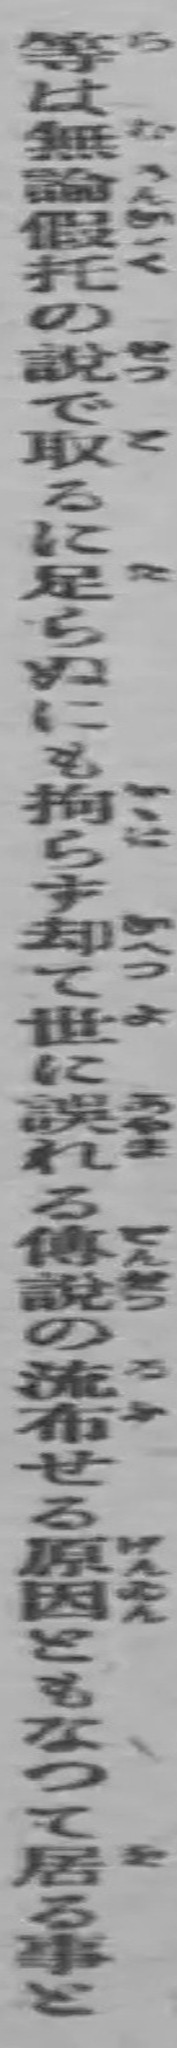等は無論仮托の説で取るに足らぬにも拘らず却て世に誤れる伝説の流布せる原因ともなつて居る事と
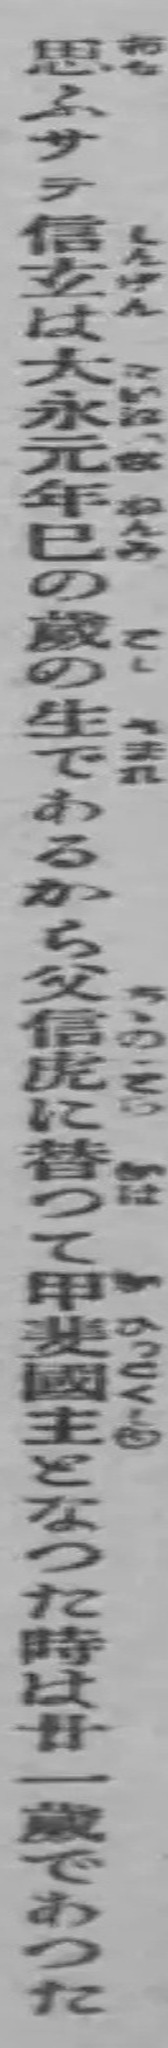信玄自立思ふサテ信玄は大永元年巳の歳の生であるから父信虎に替つて甲斐国主となつた時は廿一歳であつた
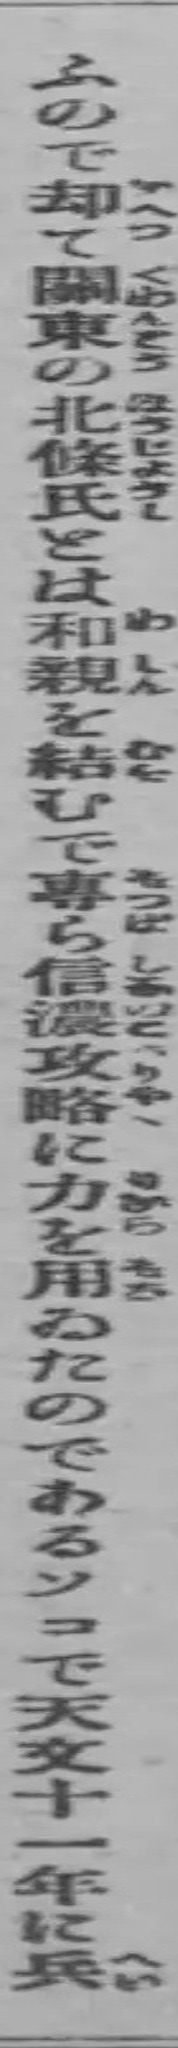ふので却て関東の北条氏とは和親を結むで専ら信濃攻略に力を用ゐたのであるソコで天文十一年に兵
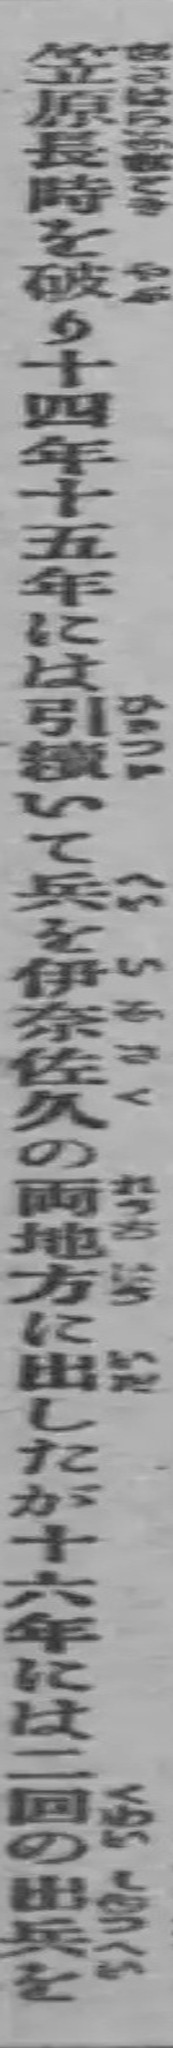笠原長時を破り十四年十五年には引続いて兵を伊奈佐久の両地方に出したが十六年には二回の出兵を
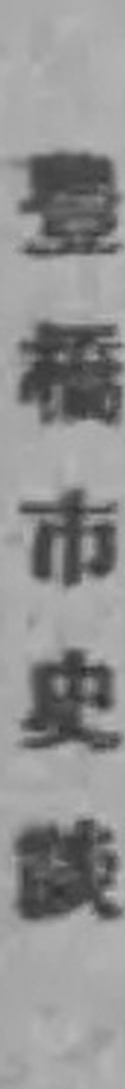豊橋市史談
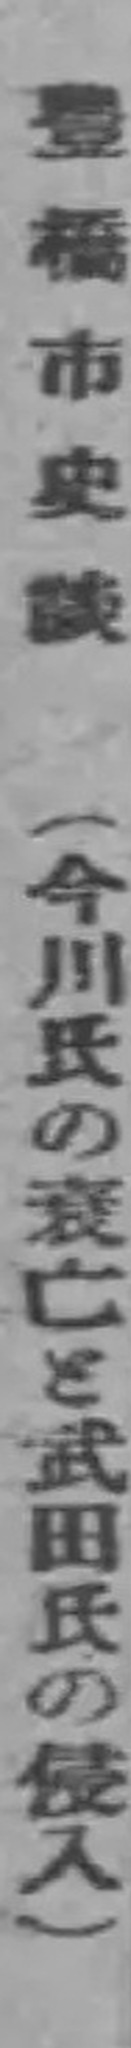豊橋市史談

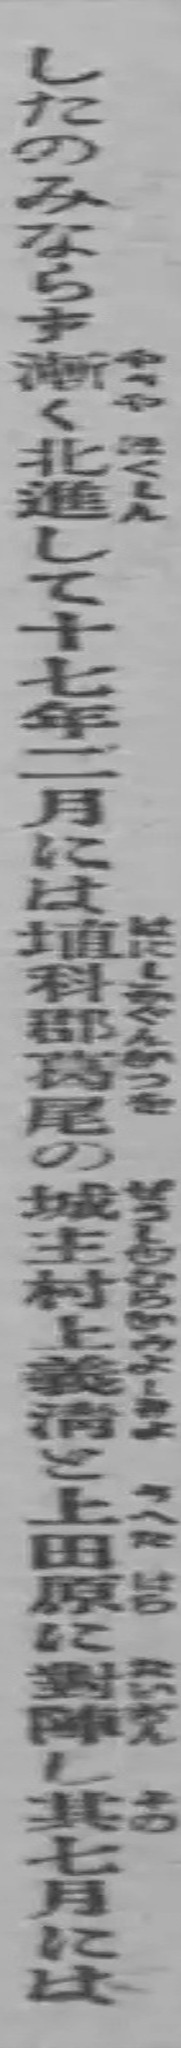したのみならず漸く北進して十七年二月には埴科郡葛尾の城主村上義清と上田原に対陣し其七月には
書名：豊橋市史談
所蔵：国立国会図書館 National Diet Library, JAPAN
